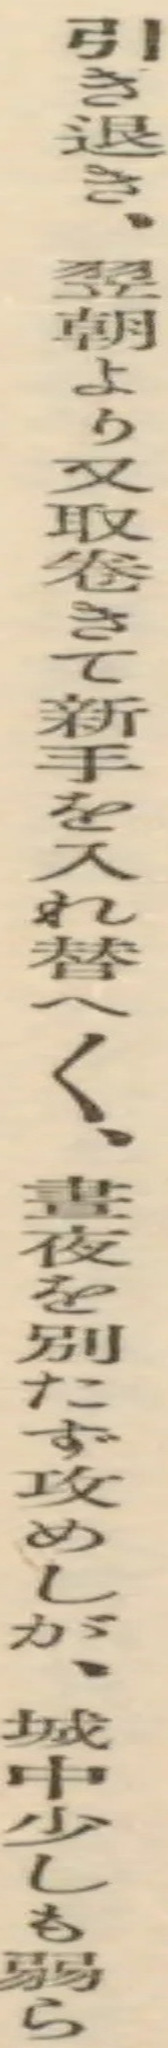引き退き、翌朝より又取巻きて新手を入れ替え〳〵、昼夜を別たず攻めしが、城中少しも弱ら
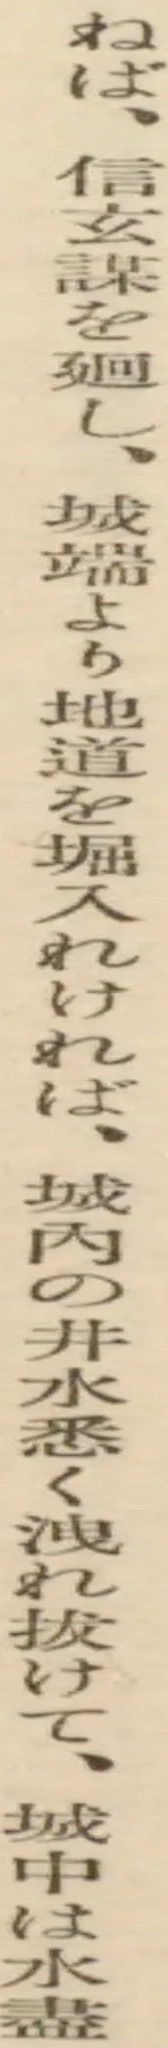ねば、信玄謀を廻し、城端より地道を堀入れければ、城内の井水悉く洩れ抜けて、城中は水尽
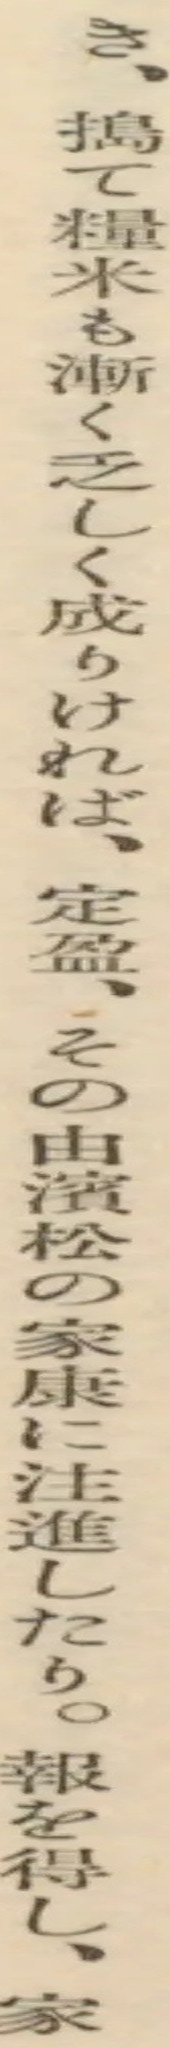き、搗て糧米も漸く乏しく成りければ、定盈、その由浜松の家康に注進したり。報を得し、家
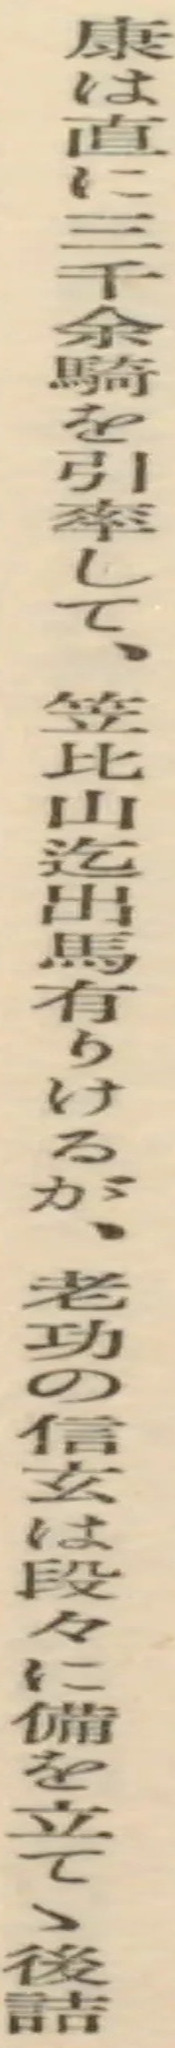康は直に三千余騎を引率して、笠比山迄出馬有りけるが、老功の信玄は段々に備を立てゝ後詰
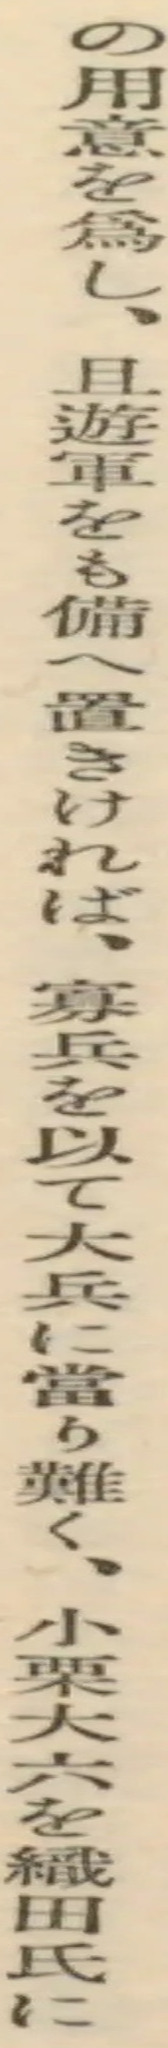の用意を為し、且遊軍をも備へ置きければ、寡兵を以て大兵に当り難く、小栗大六を織田氏に
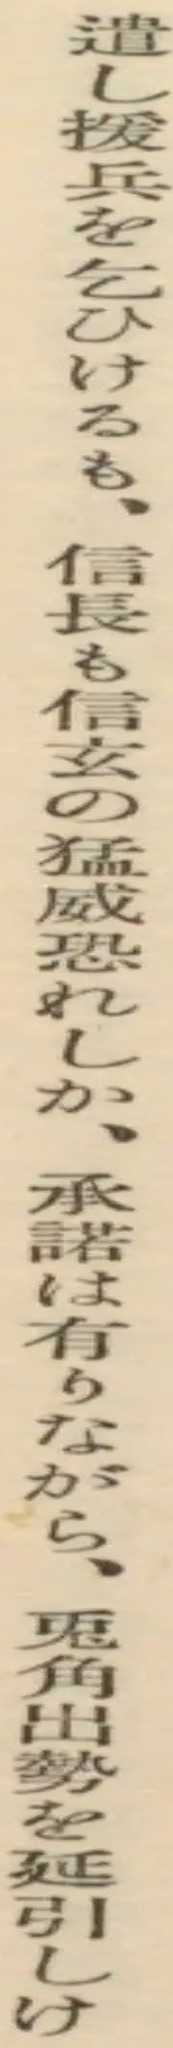遣し援兵を乞ひけるも、信長も信玄の猛威恐れしか、承諾は有りながら、兎角出勢を延引しけ
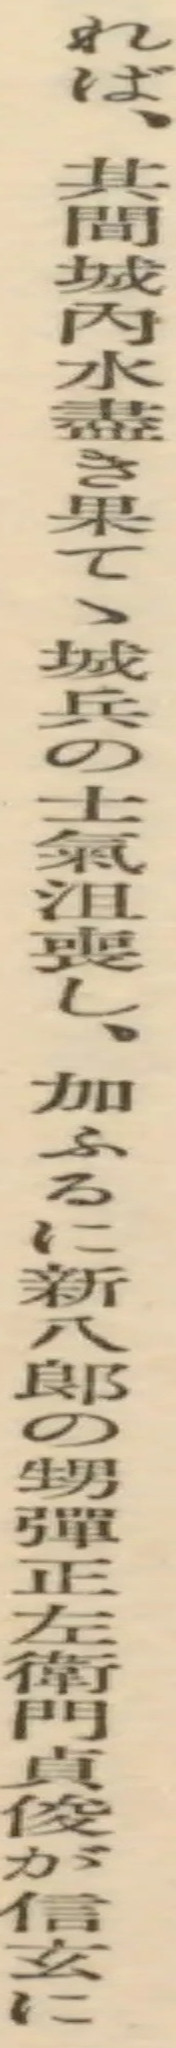れば、其間城内水尽き果てゝ城兵の士気沮喪し、加ふるに新八郎の甥弾正左衛門貞俊が信玄に
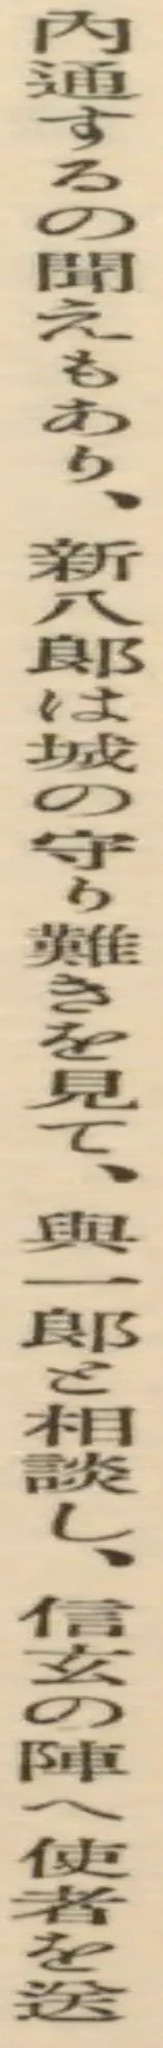内通するの聞えもあり、新八郎は城の守り難きを見て、與一郎と相談し、信玄の陣へ使者を送
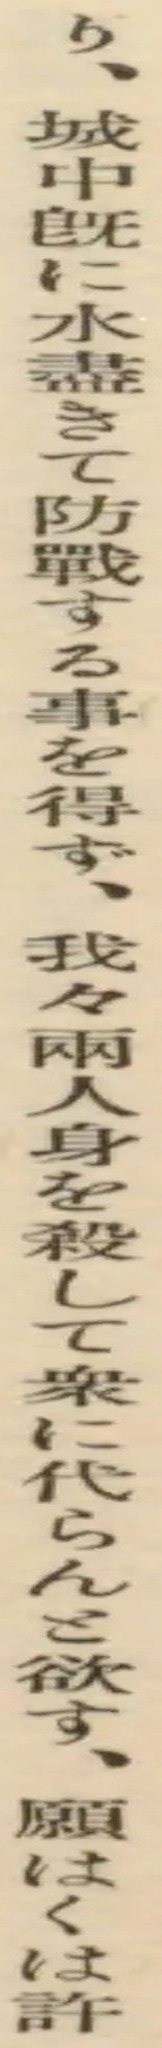り、城中既に水尽きて防戦する事を得ず、我々両人身を殺して衆に代らんと欲す、願はくは許
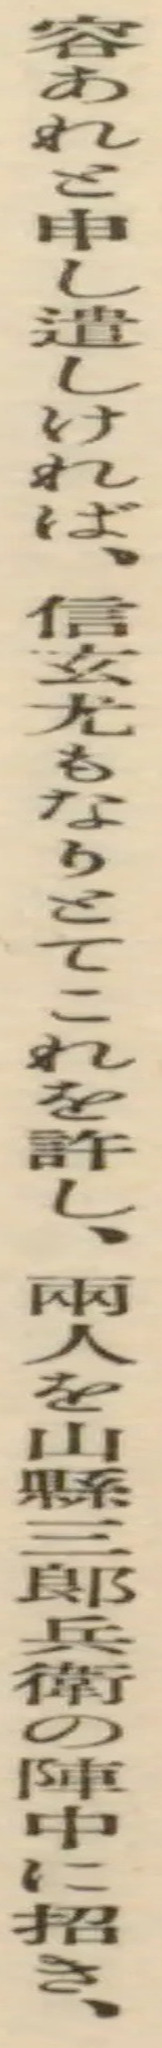容あれと申し遣しければ、信玄尤もなりとてこれを許し、両人を山縣三郎兵衛の陣中に招き、
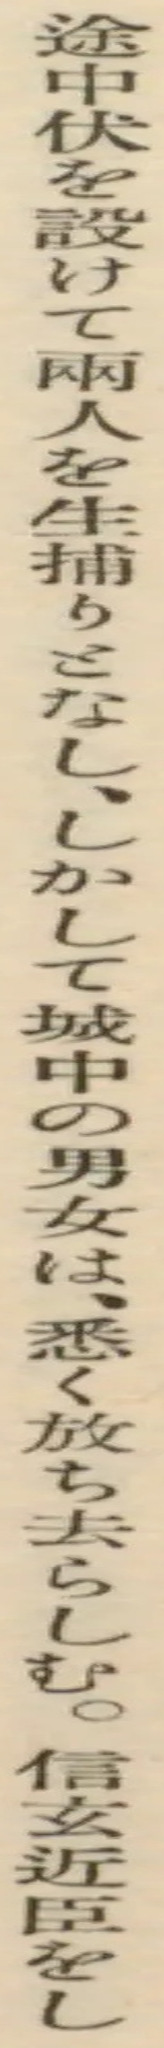途中伏を設けて両人を生捕りとなし、しかして城中の男女は、悉く放ち去らしむ。信玄近臣をし
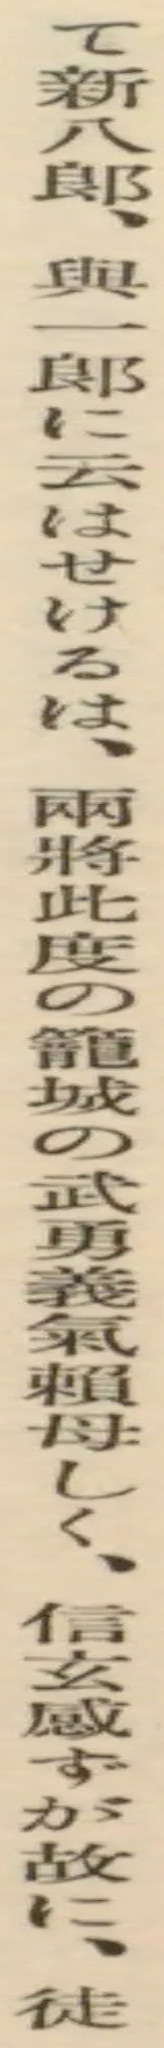て新八郎、與一郎に云はせけるは、両将此度の籠城の武勇義気頼母しく、信玄感ずが故に、徒
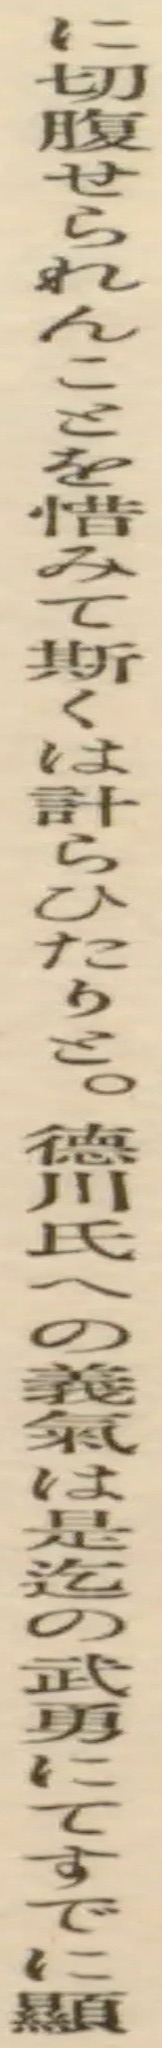に切腹せられんことを惜みて斯くは計らひたりと。徳川氏への義気は是迄の武勇にてすでに顕
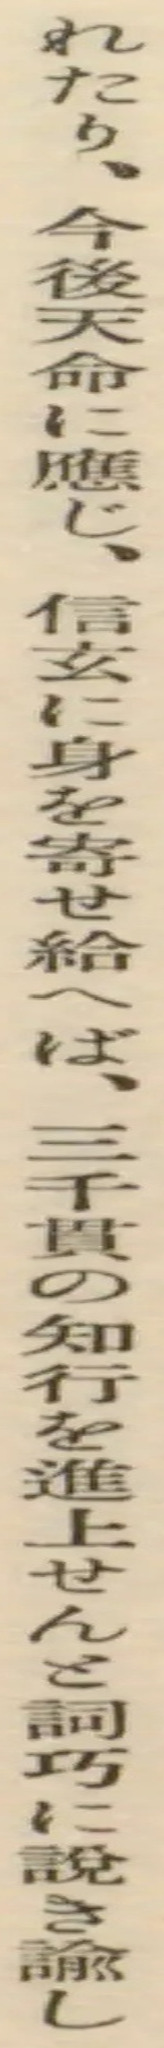れたり、今後天命に応じ、信玄に身を寄せ給へば、三千貫の知行を進上せんと詞巧に説き諭し
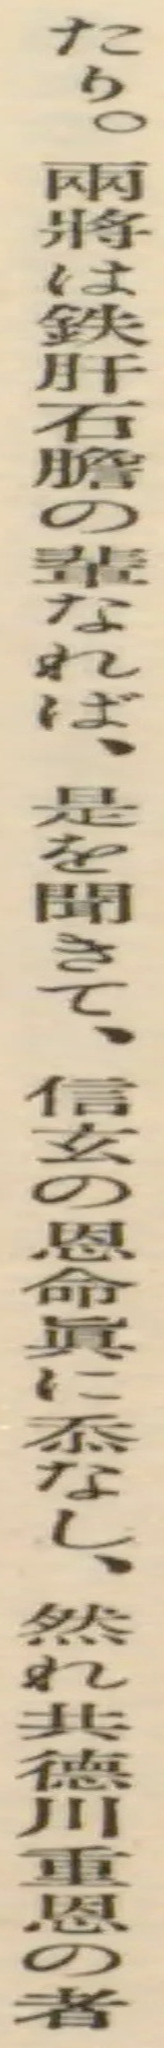たり。両将は鉄肝石胆の輩なれば、是を聞きて、信玄の恩命真に忝なし、然れ共徳川重恩の者
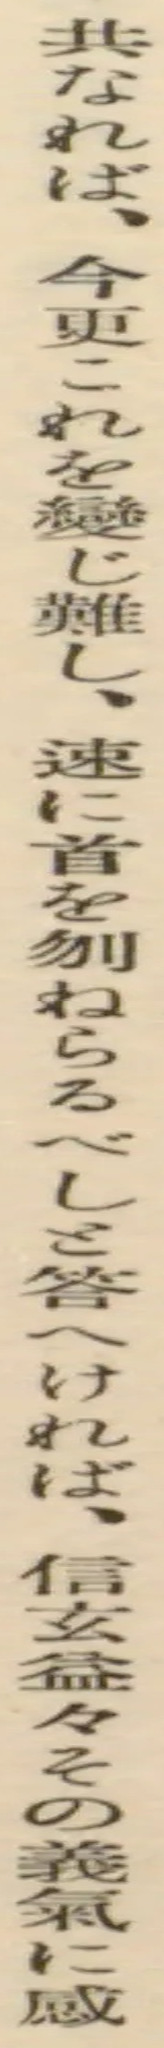共なれば、今更これを変じ難し、速に首を刎ねらるべしと答へければ、信玄益々その義気に感
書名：東三河之古城
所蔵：国立国会図書館 National Diet Library, JAPAN
